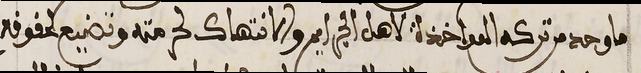ما وحد من تركه المواخذة لاهل الجرايم و الانتهاك لحرمته و تضيع لحقوقه
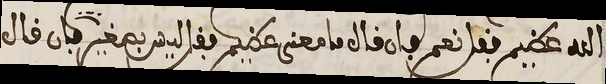الله عظيم فقل نعم فان قال ما معنى عظيم فقل ليس بصغير فان قال
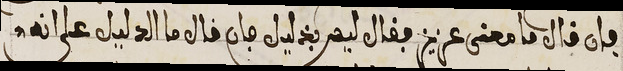فان قال ما معنى عزيز فقال ليس بذليل فان قال ما الدليل على انه
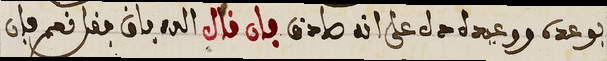بوعده و وعيده دل على انه صادق فان قال الله باق فقل نعم فان
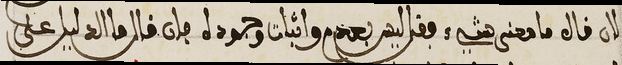لان قال ما معنى شيء فقل ليس بعد م و اثبات وجوده فان قال ما الدليل على
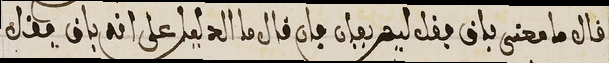قال ما معنى باق فقل ليس بفان فان قال ما الدليل على انه باق فقل
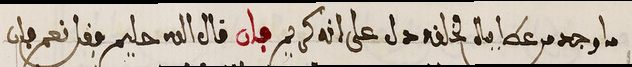ما وجد من عطاياه لخلقه دل على انه كريم فان قال الله حليم فقل نعم فان
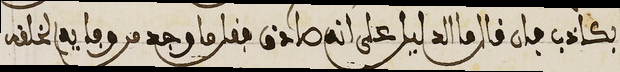بكاذب فان قال ما الدليل على انه صادق فقل ما وجد من وقايه لخلقه
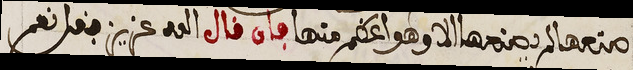صنعها لم يصنعها الا وهو اعظم منها فان قال الله عزيز فقل نعم
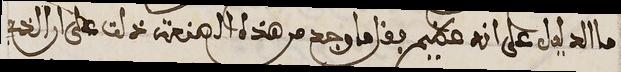ما الدليل على انه عظيم فقل ما وجد من هذه الصنعة ذلت على ان الذى
